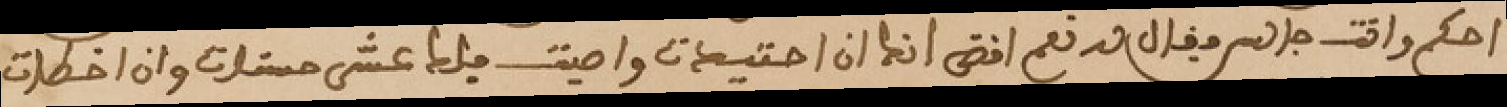احكم وانة جالس يقال له نعم اقض انك ان # # فلك عشى حسنات وان اخطات
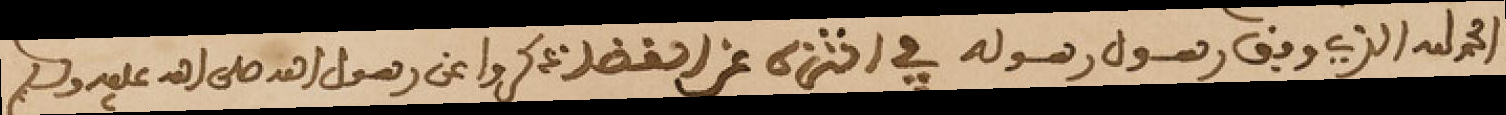الحمد لله الذي وفق رسول رسوله في # عن الفضل ذكروا عن رسول الله صلى الله عليه وسلم
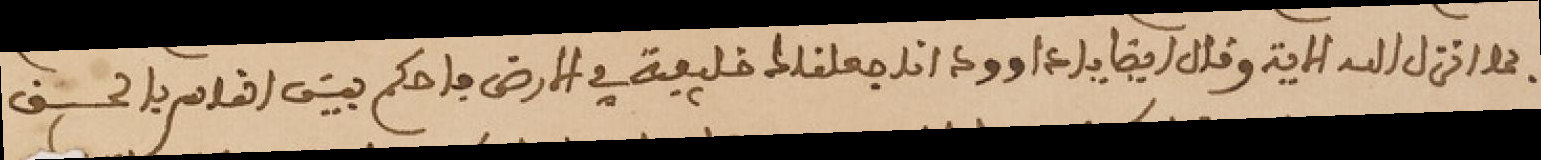بما انزل الله الاية وقال ايضا يا داود انا جعلناك خليفة في الارض فاحكم بين الناس بالحق
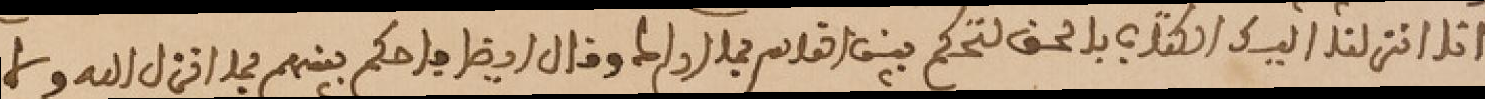انا انزلنا اليك الكتاب بالحق لتحكم بين الناس بما اراك الله وقال ايضا فاحكم بينهم بما انزل الله ولا
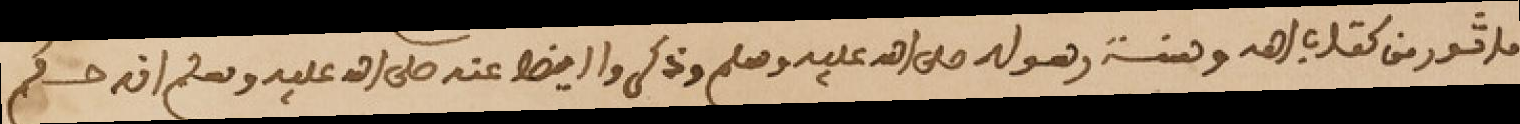ماثور من كتاب الله وسنة رسوله صلى الله عليه وسلم وذكروا ايضا عنه صلى الله عليه وسلم انه حكم
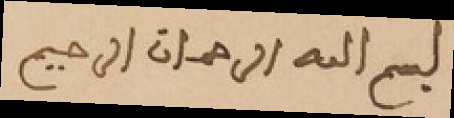باسم الله الرحمان الرحيم
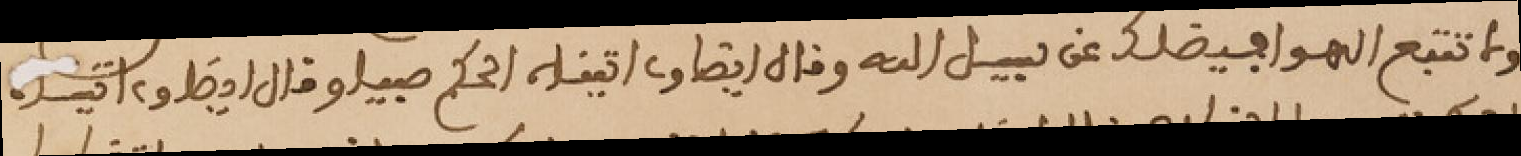ولا تتبع الهوا فيضلك عن سبيل الله وقال ايضا اتفق له الحكم صبيا وقال ايضا واتينا
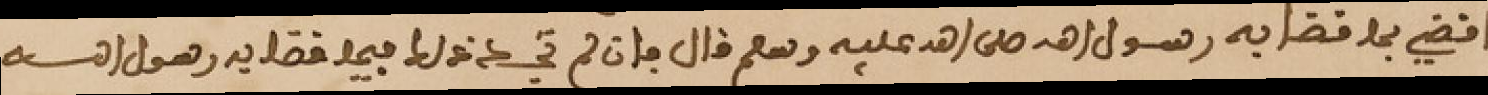اقضي بما قضى به رسول الله صلى الله عليه وسلم قال فان لم تجد ذلك فيما قضى به رسول الله
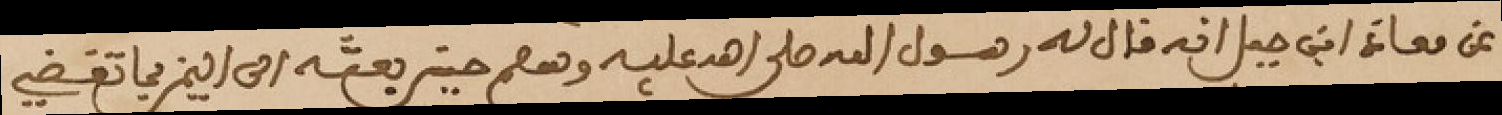عن معاذ ابن جبل انه قال له رسول الله صلى الله عليه وسلم حين بعثه الى اليمن بما تقضي
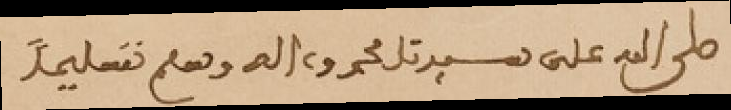باسم الله الرحمن الرحيم صلى الله على سيدنا محمد وآله وسلم تسليما
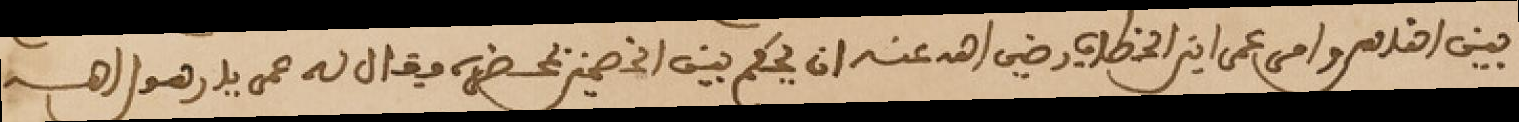بين الناس وامر عمر ابن الخطاب رضي الله عنه ان يحكم بين الخصمين بمحضره يقال له عمر يا رسول الله
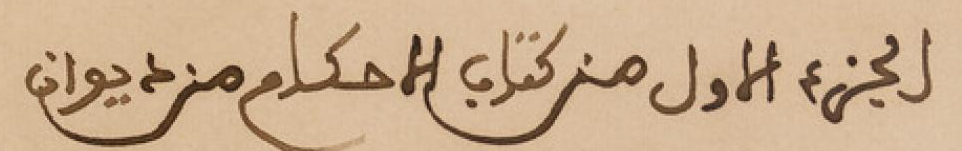الجزء الاول من كتاب الأحكام من ديوان
